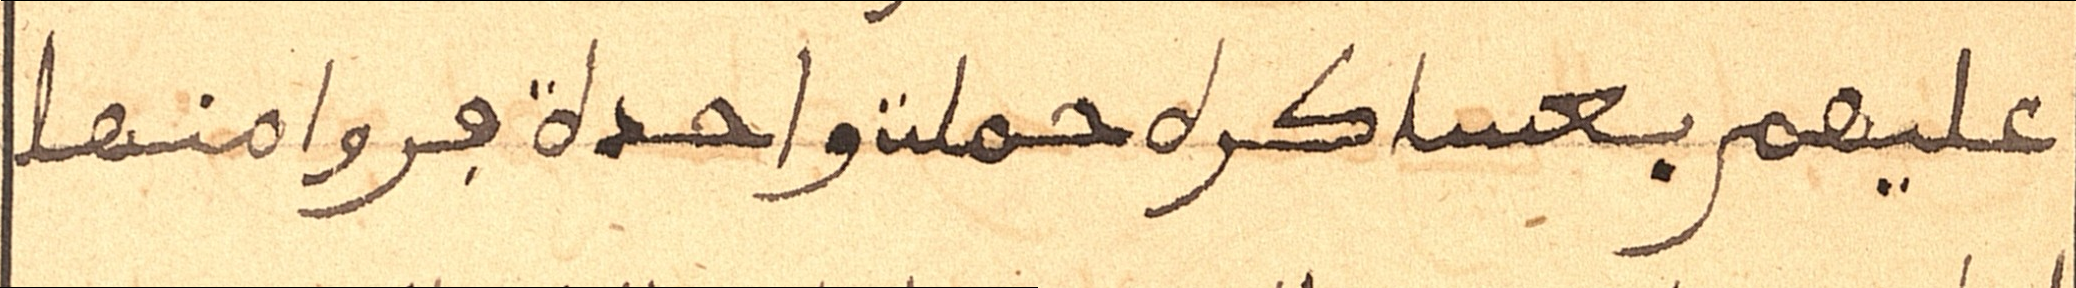عليهم بعساكره حملت واحدة فروا منها
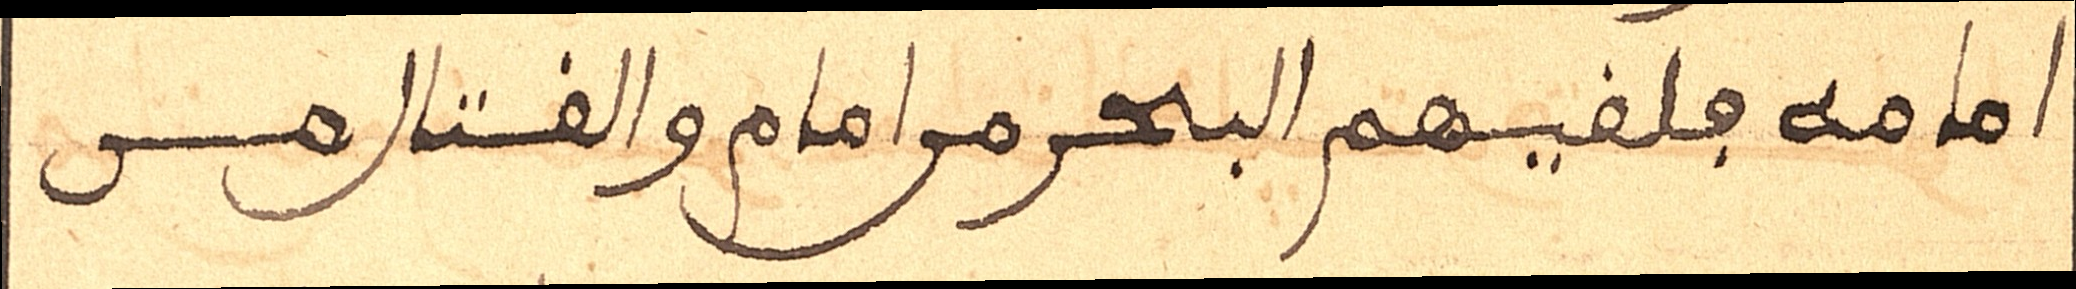امامه فلقيهم البحر من امام والقتال من
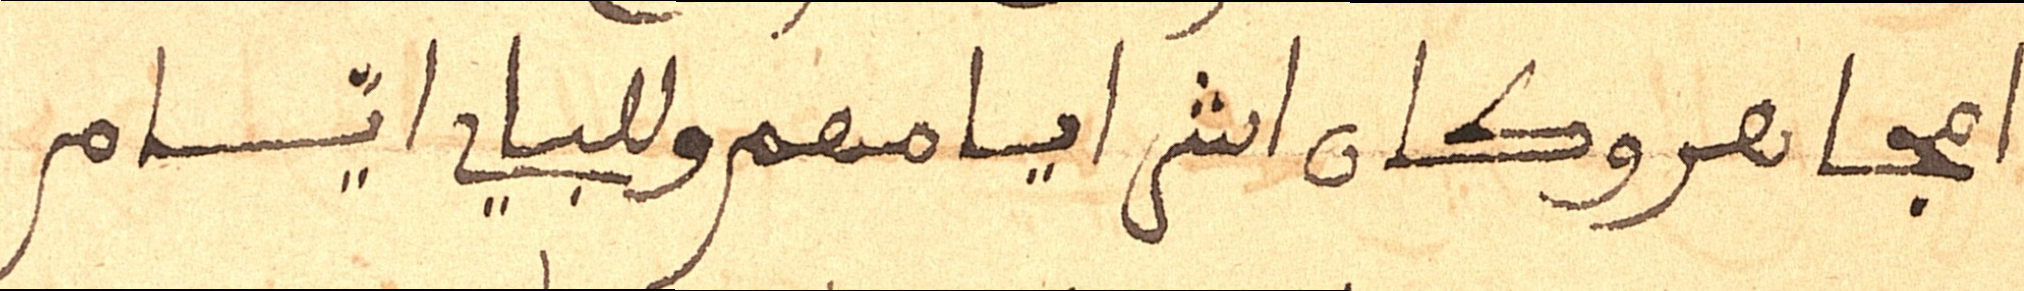امجاهر وكان اشرا يا مهم والباي ايام
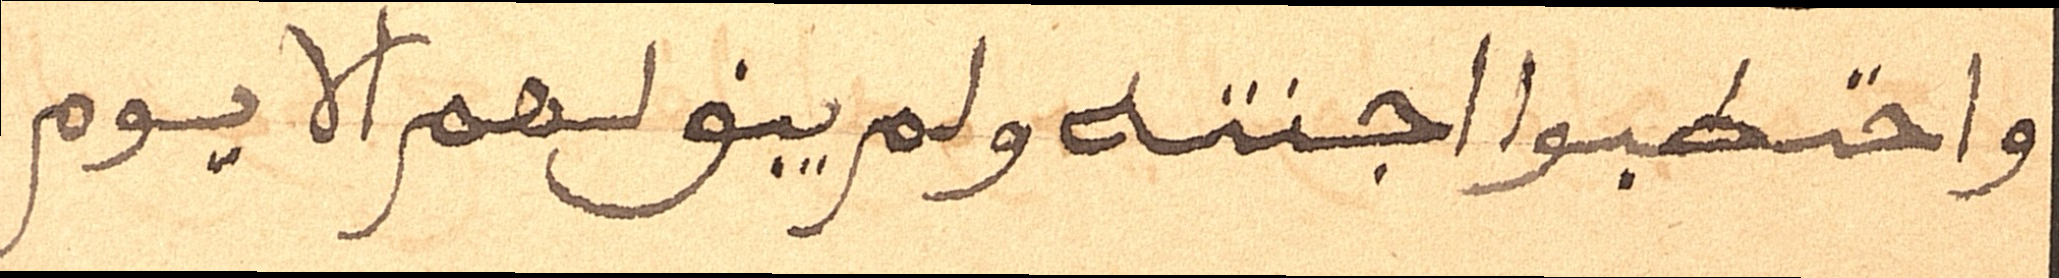واحتطبوا اجنته ولم يبق لهم الايوم
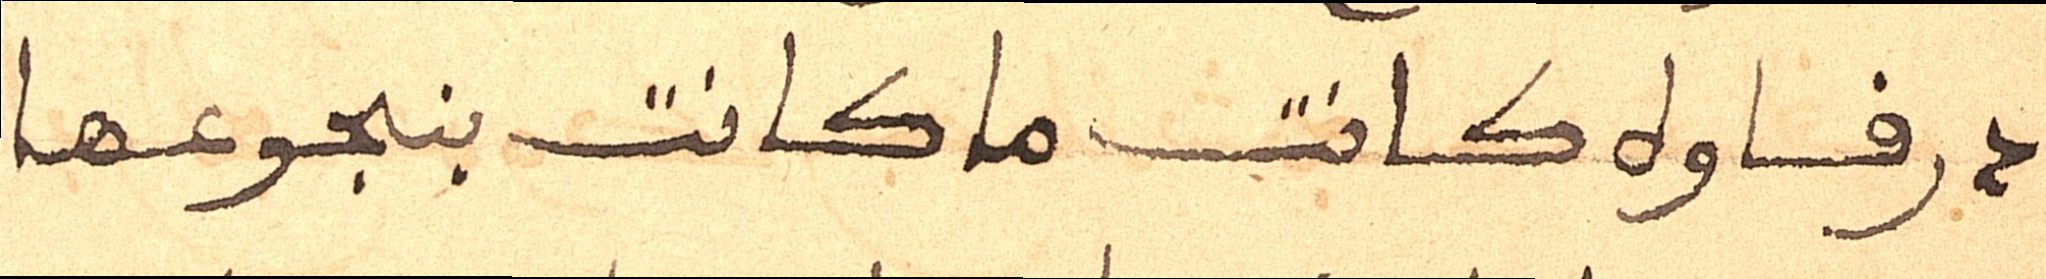درقاوه كانت ماكانت بنجوعما
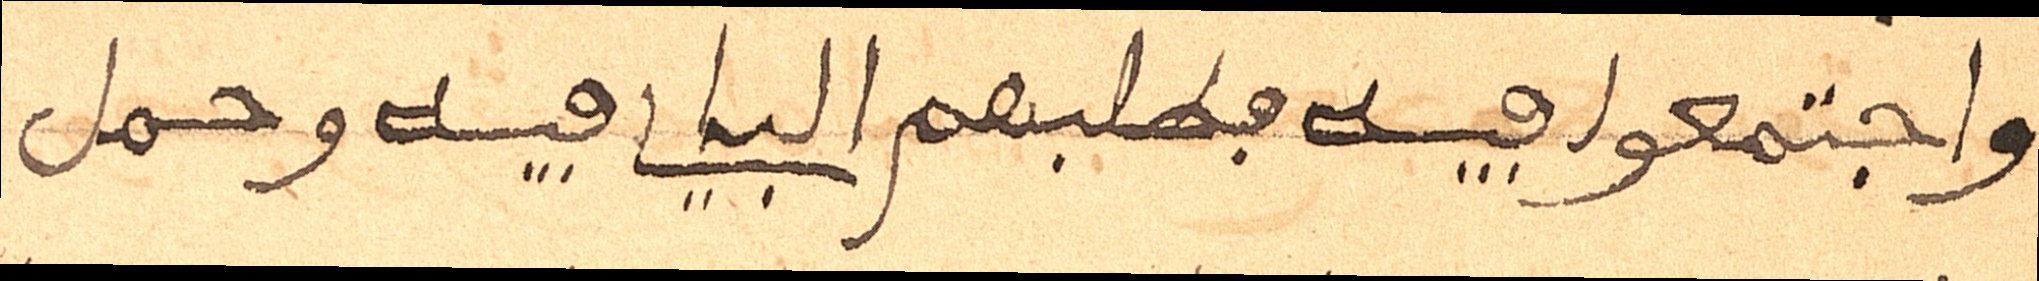واجتمعوا فيه فطلبهم الباي فيه وحمل
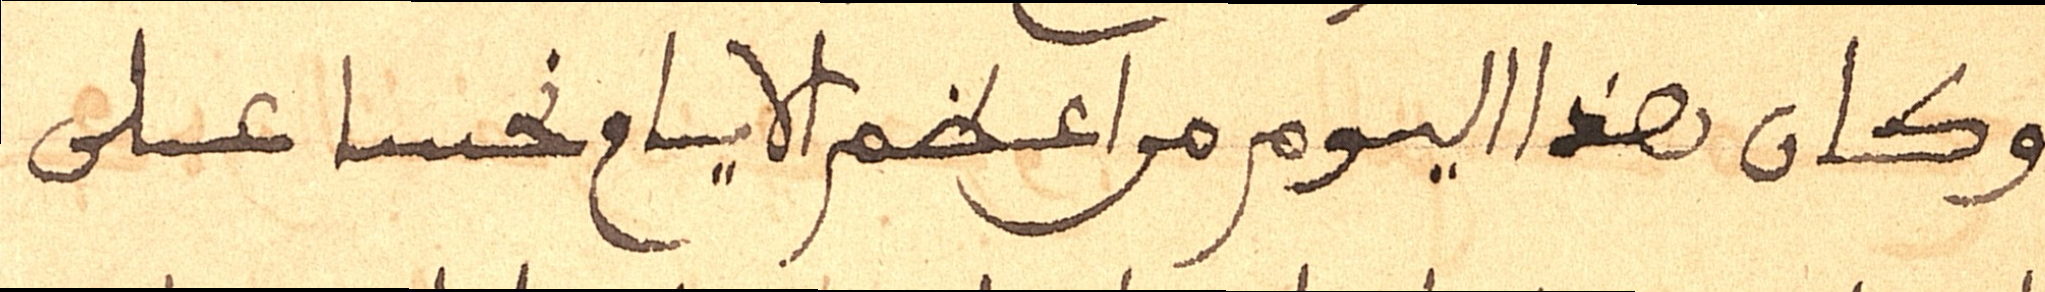وكان هذا اليوم من اعظم الايام نحسا على
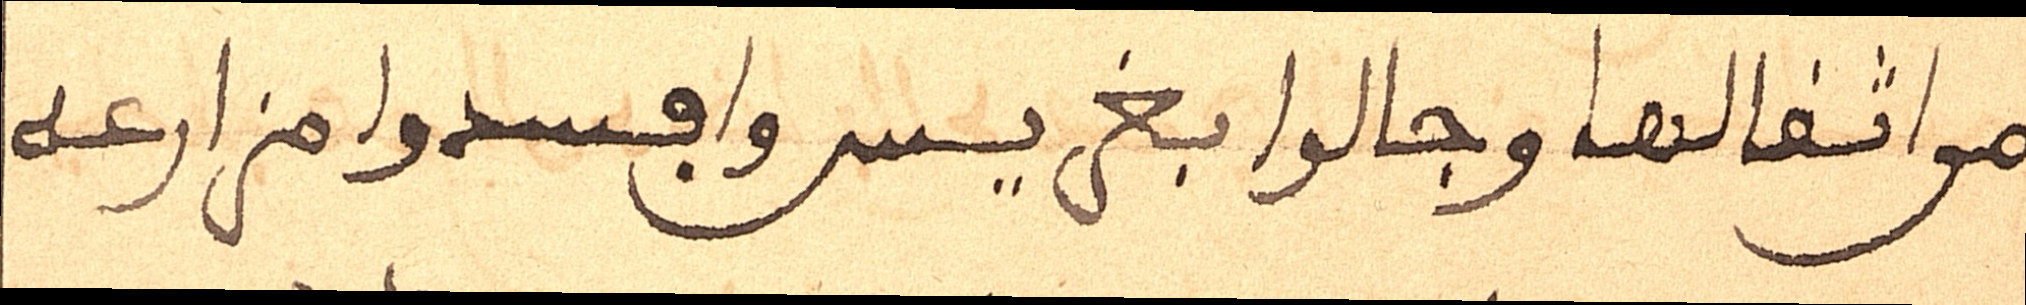من اثقالها وجالوا بغريس وافسدوا مزارعه
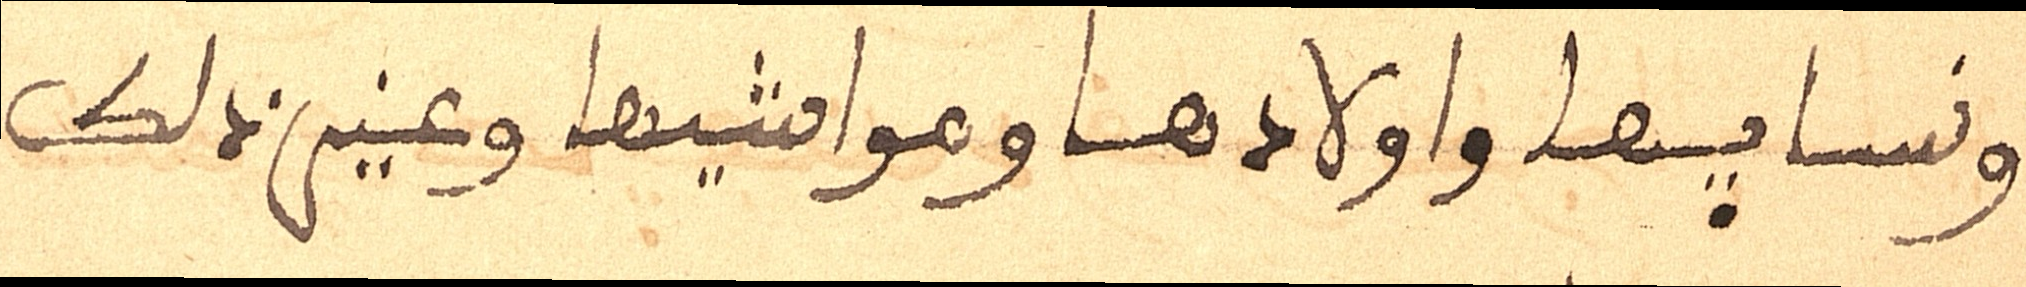ونسائها واولادها ومواشيها وغير ذلك
